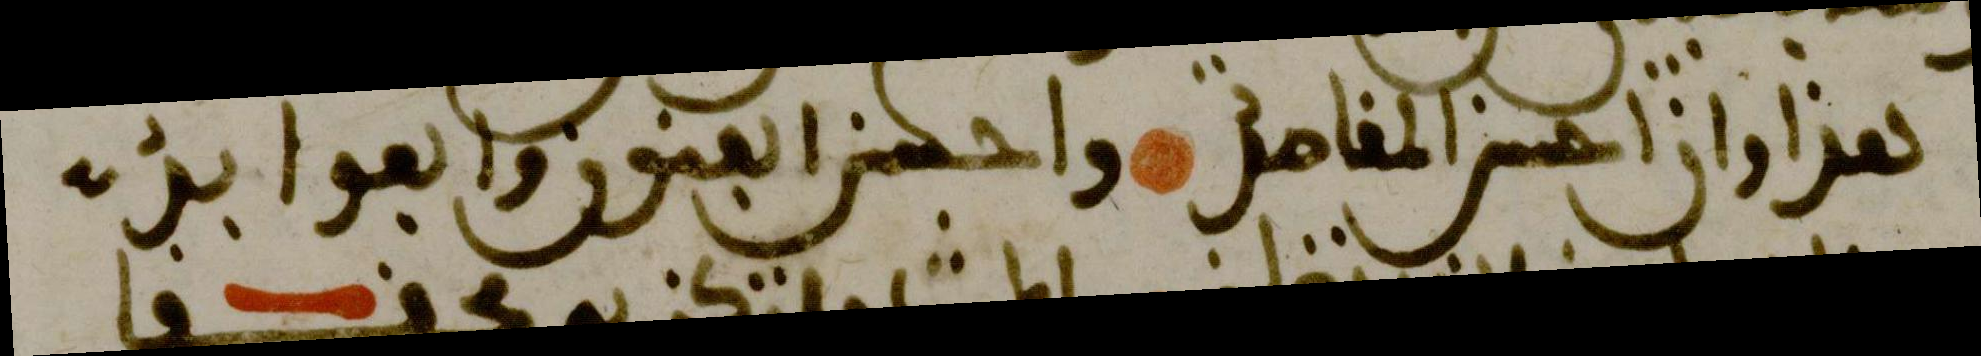هذا وان احسن المقاصد واحسن الفنون والفوايد
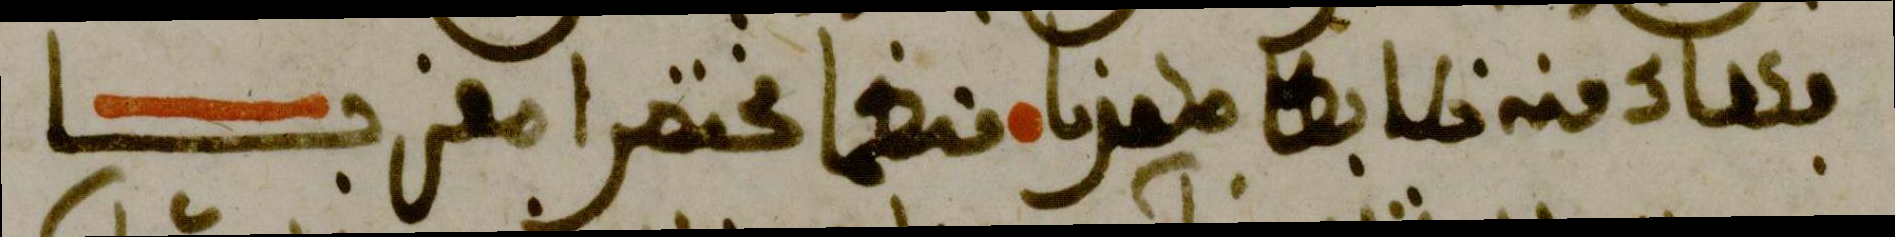فهاك منه خلابطا مهذبا منظما مختصرا مقربا
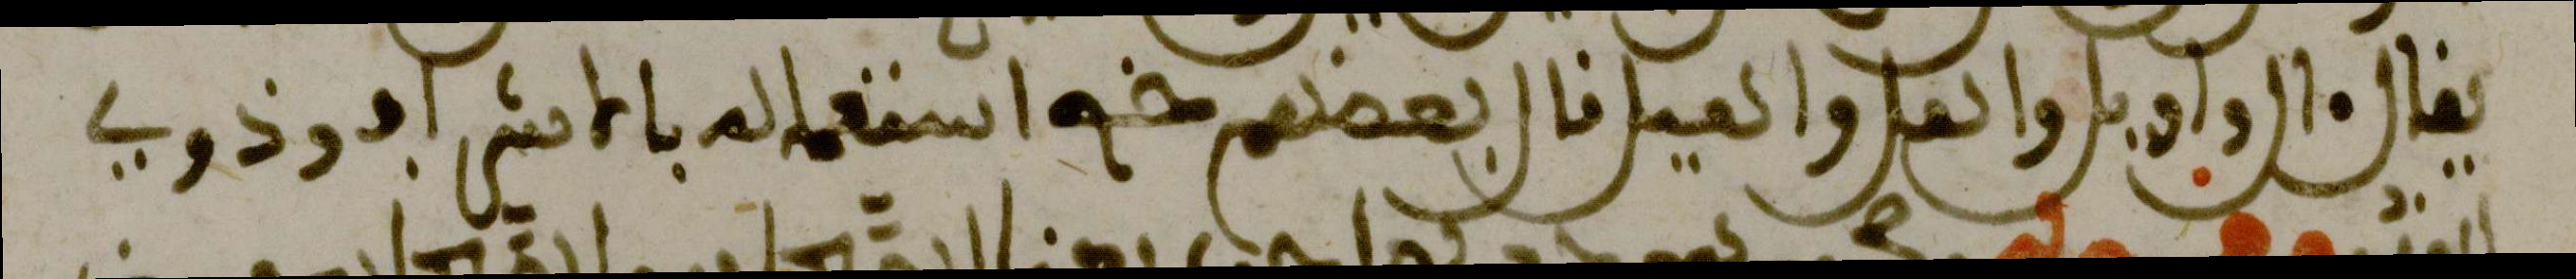يقال ءال واويل واهل واهيل قال بعضهم خص استعماله بالاشراف وذوي
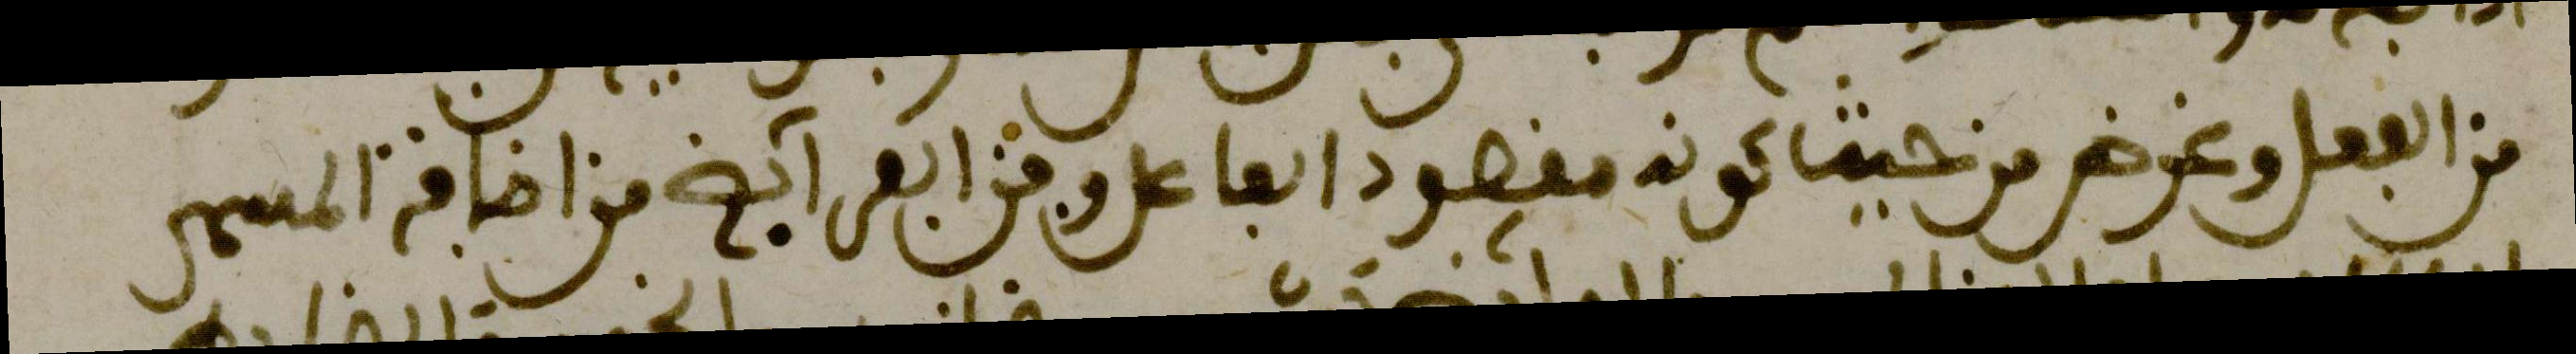من الفعل وغرض من حيث كونه مقصود الفاعل وفن الفرائض من اضافة المسمى
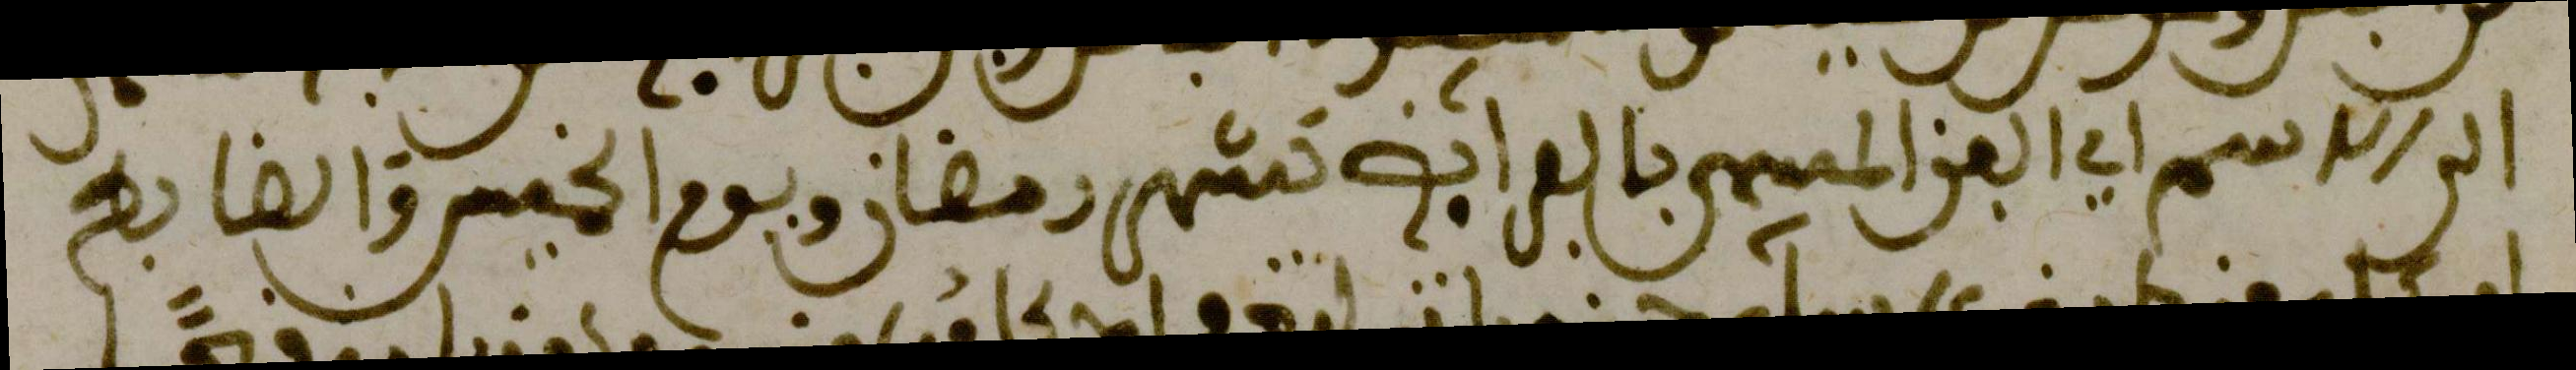الى الاسم اي الفن المسمى بالفرائض كشهر رمضان ويوم الخميس والضابط
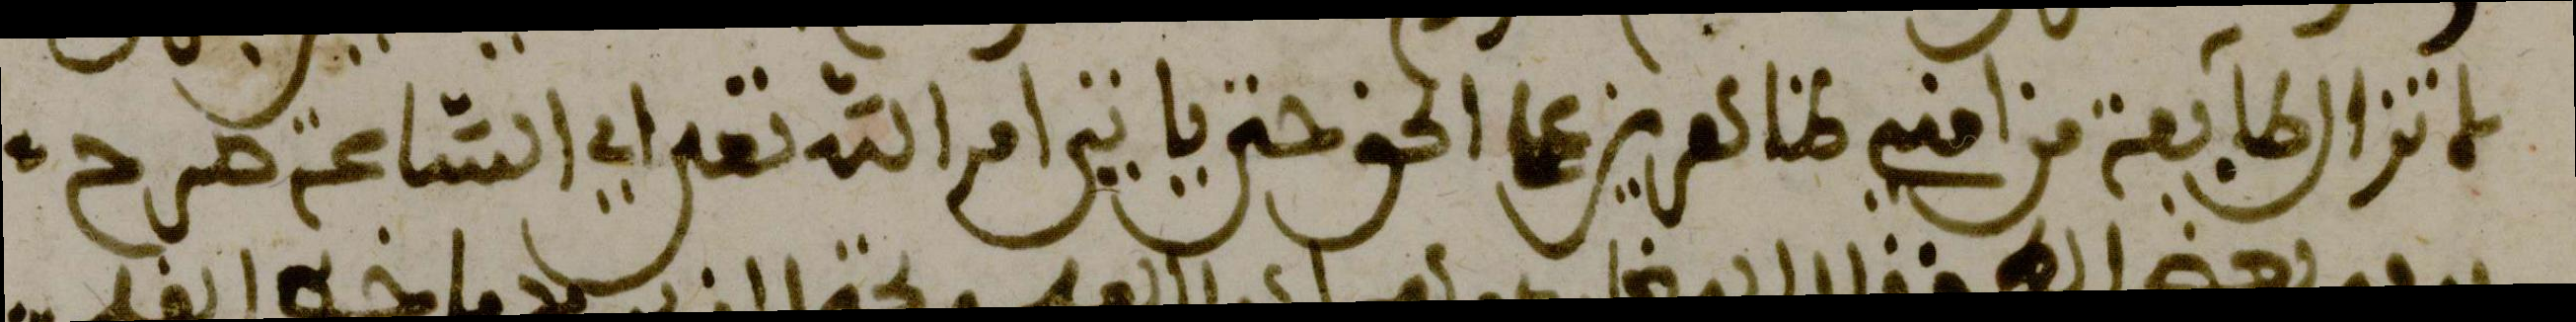لاتزال طائفة من امني ظاهرين على الحق حتى يأتي امر الله تعلى اي السّاعة صرح
